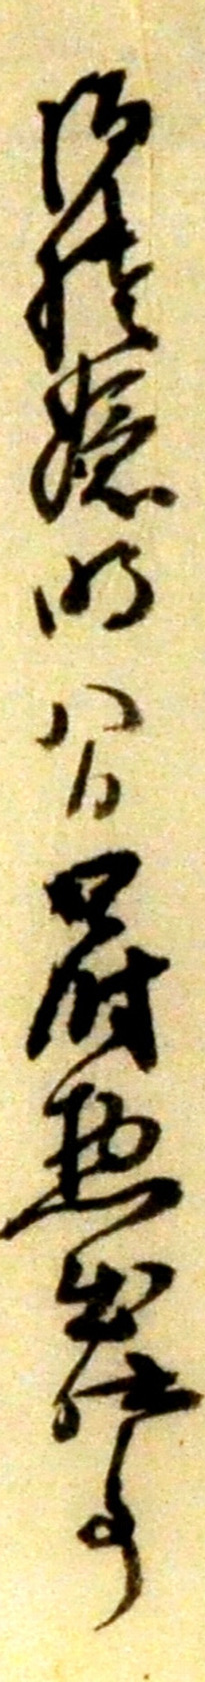御機嫌明八日四時惣出仕事
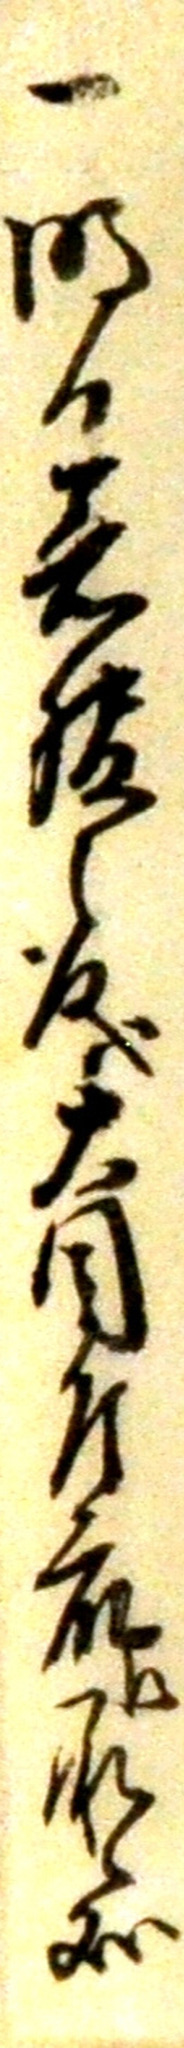一明日着服之儀大目付衆江承候処

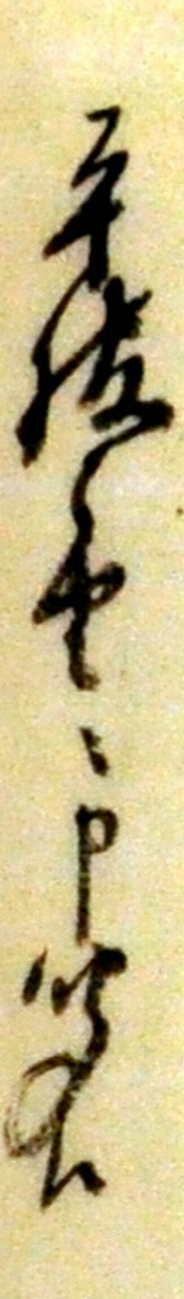平服候由ニ申聞候
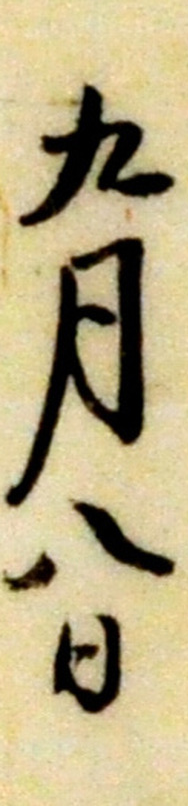九月八日
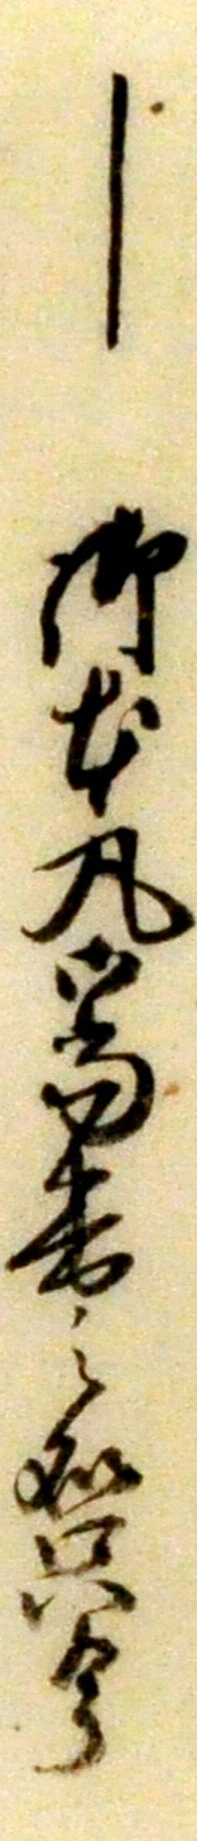御本丸御当番之処只今
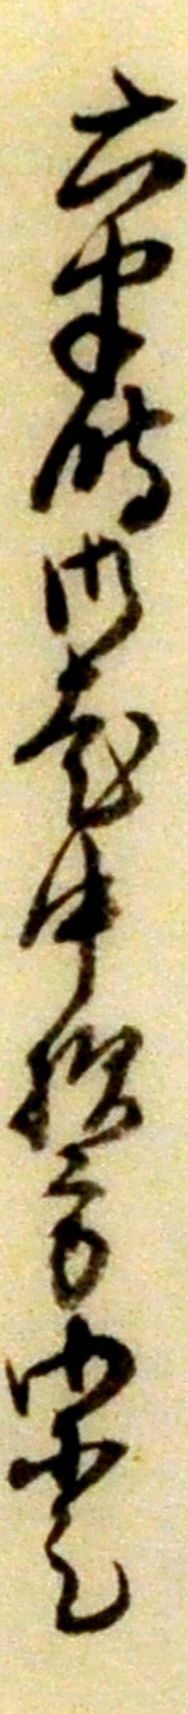六半時御老中様方御登
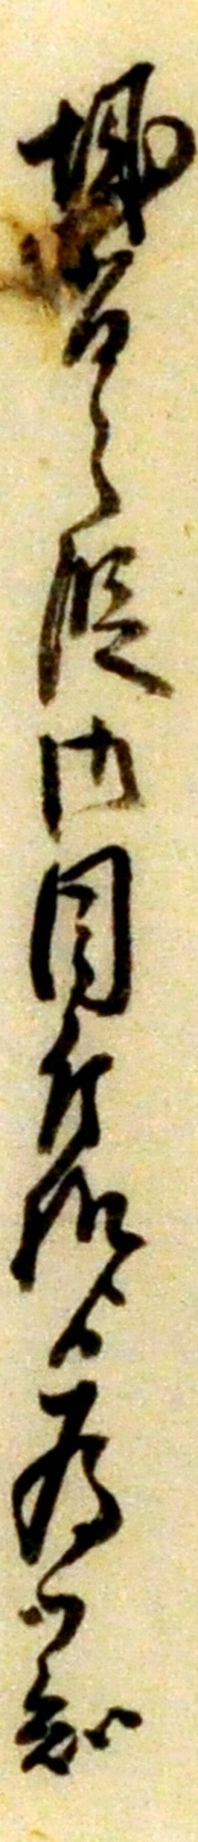城有之段御目付様ゟ為御知
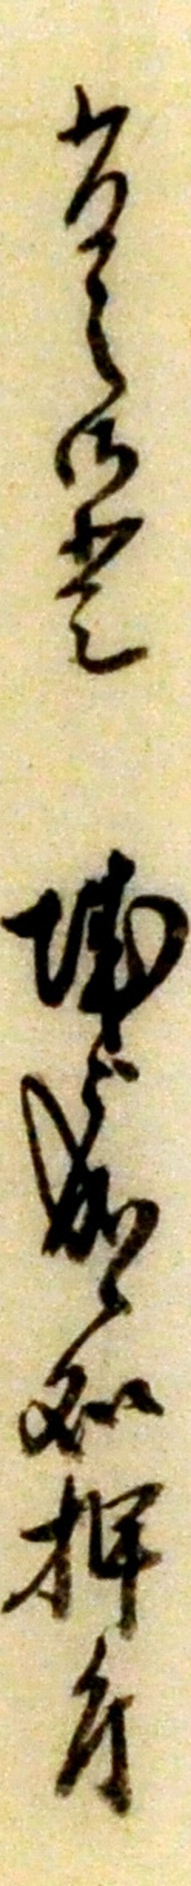有之御登城被成候処押付
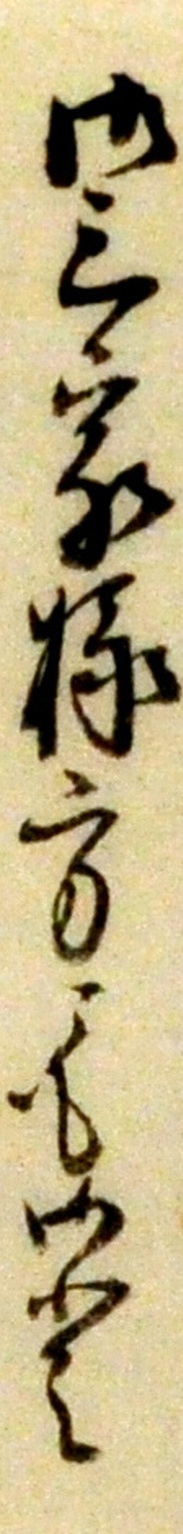御三家様方ニも御登
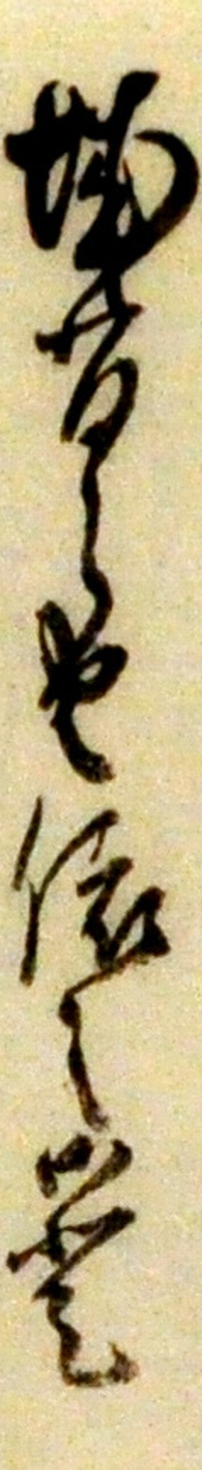城有之由依之御登
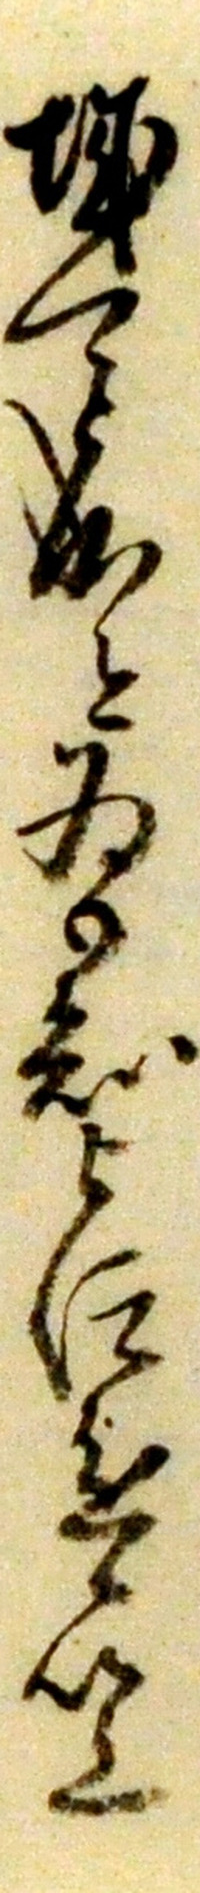城可被成と為御知被仰進候以上
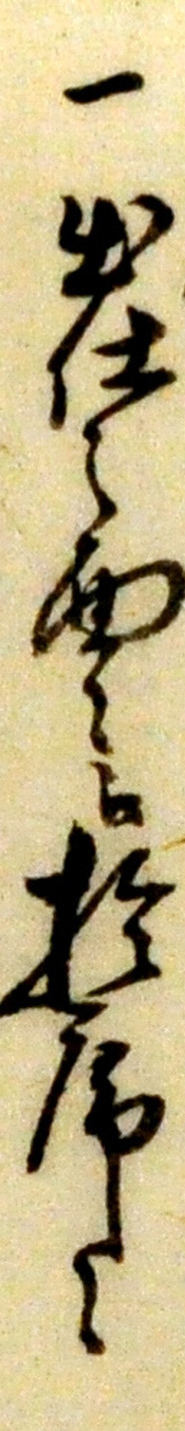一出仕之面々江於席々
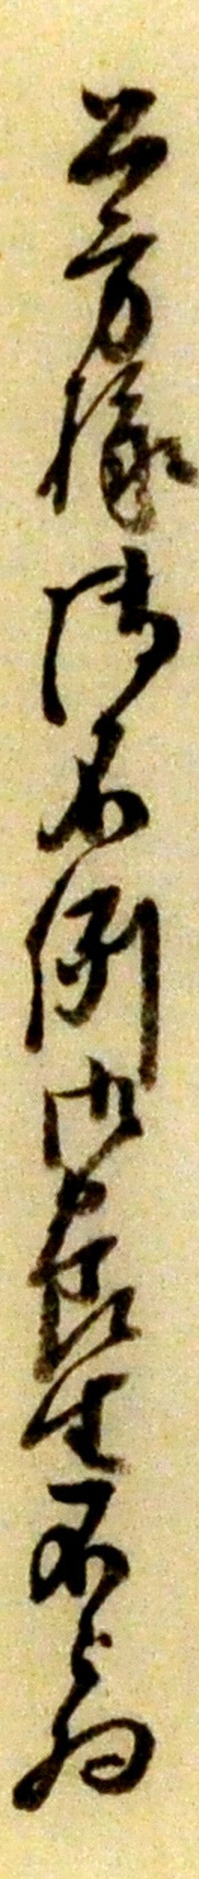公方様御不例御養生不被為
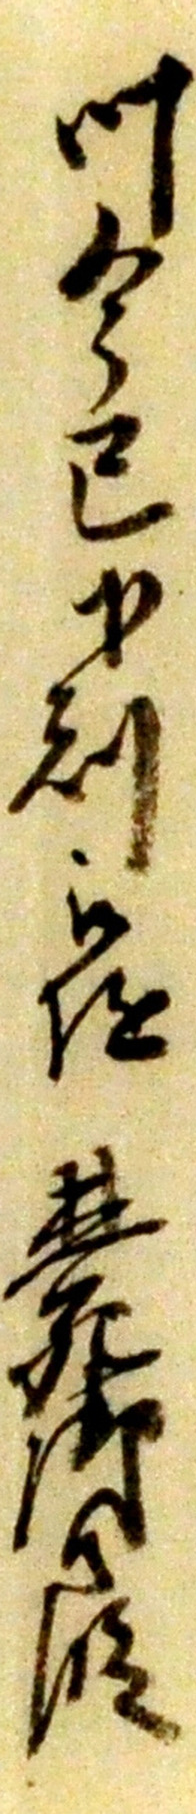叶今巳下刻被遊薨御候段
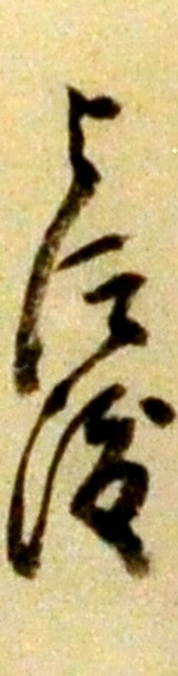被仰渡
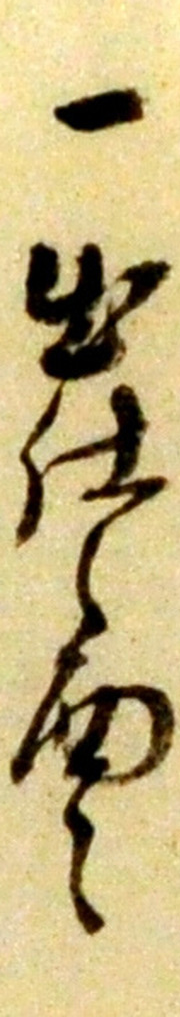一出仕之面々
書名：書抜
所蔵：伊那市立高遠町図書館・合同会社AMANE
